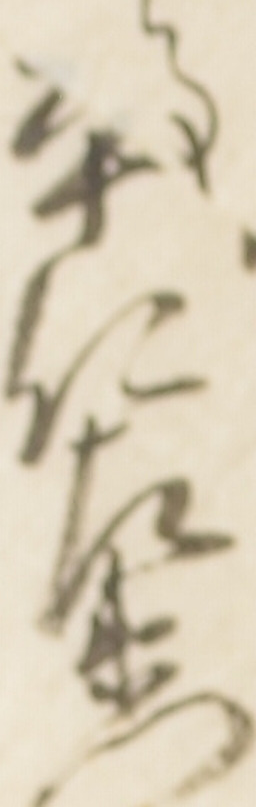用事仁左衛門

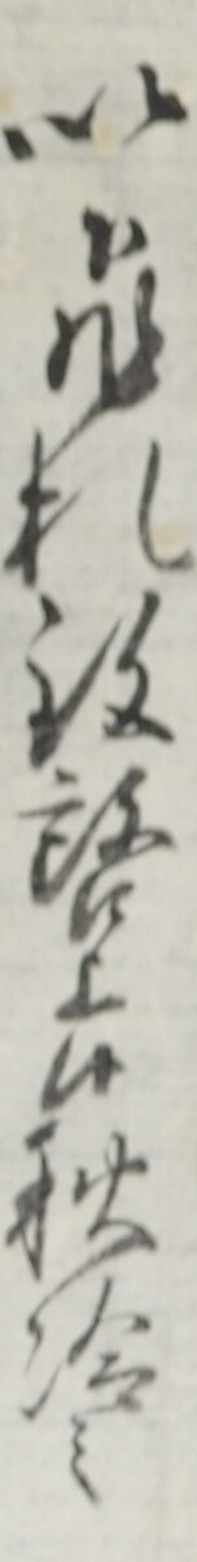以飛札致啓上候秋冷之
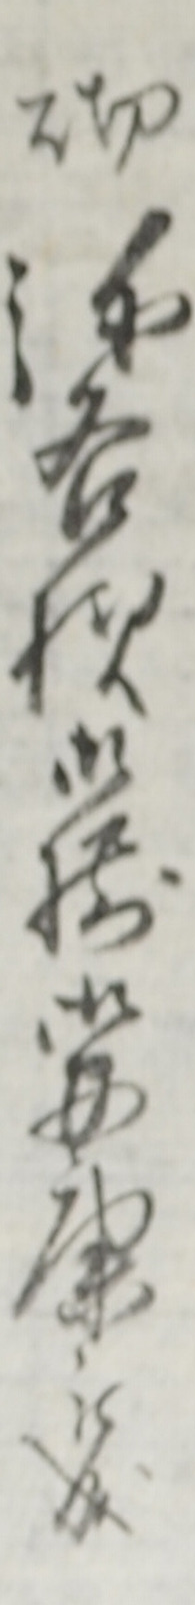砌弥各様御揃御安康被成
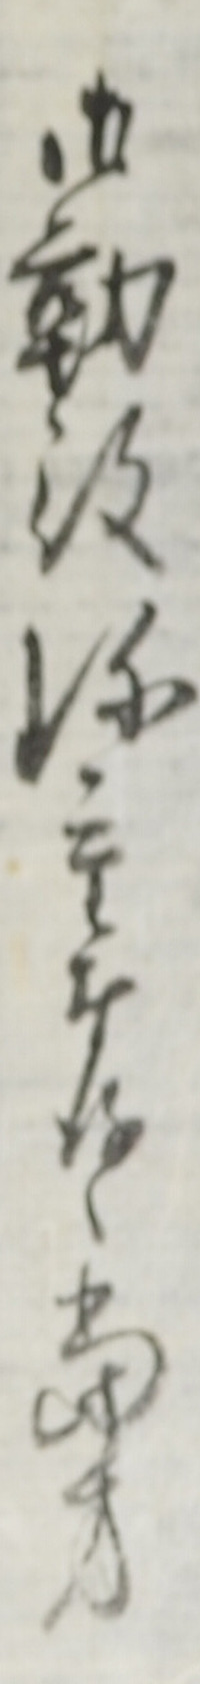御勤役珍重奉存候当方
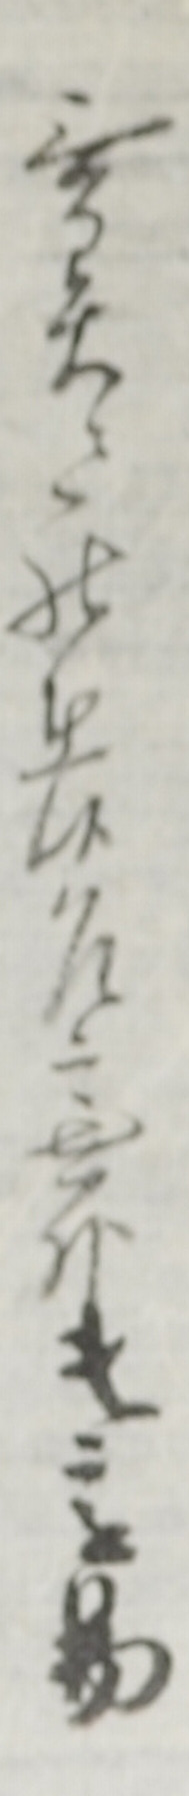無異ニ罷在候乍慮外貴意易
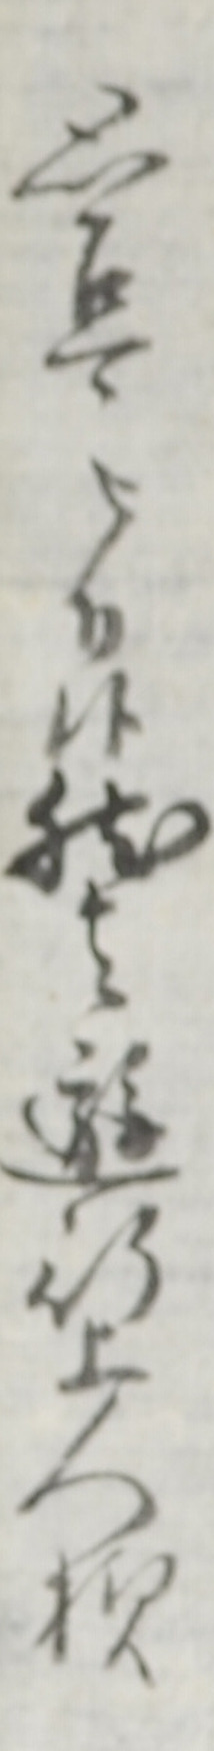思召可被下候然は遊行上人様
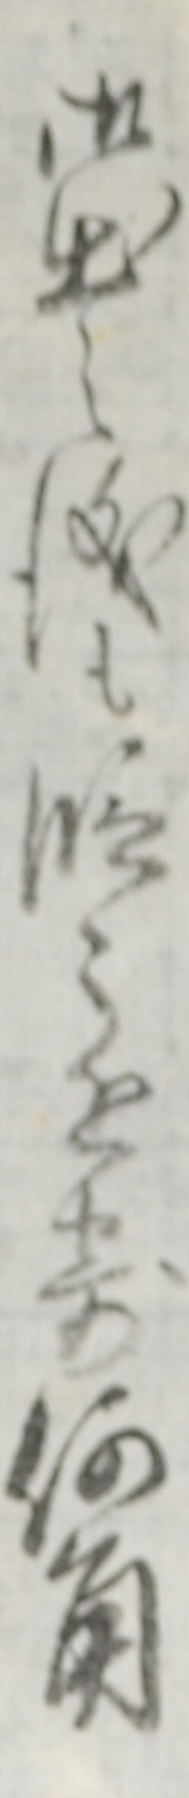御出之儀も段々近寄何角
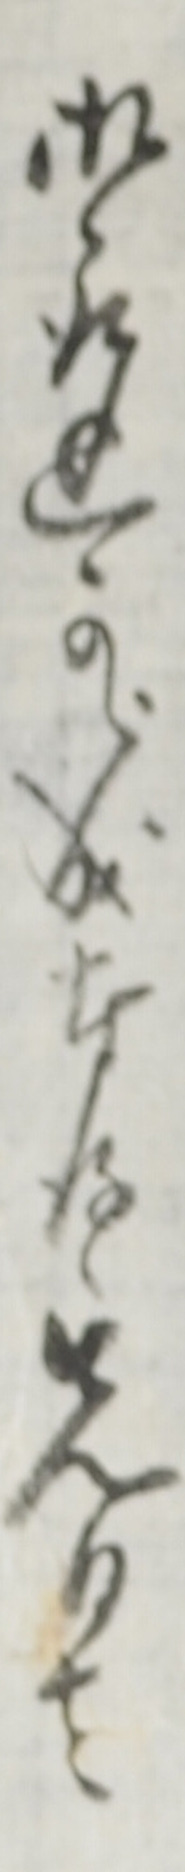御取込可被成奉存候先日は
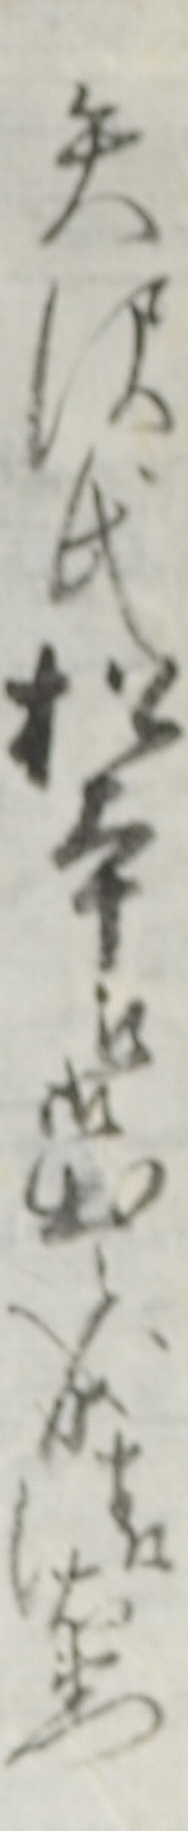矢沢氏松本江御出被成清右衛門
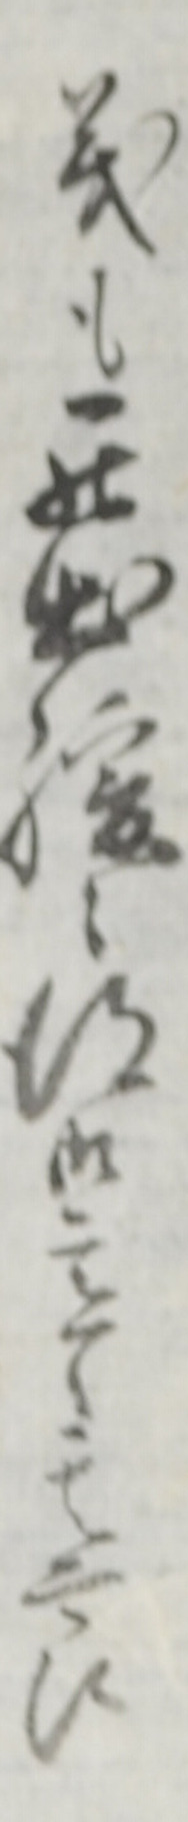義も罷出緩々得御意候其節
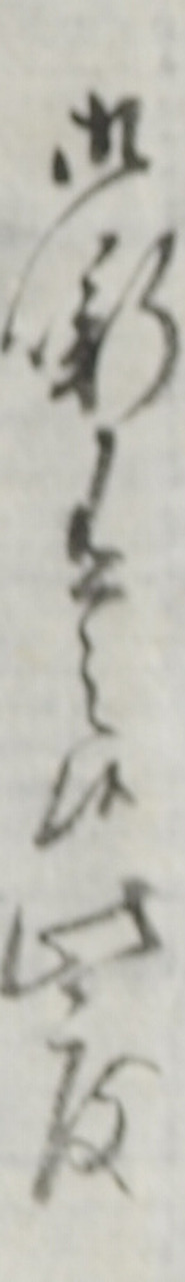御噺有之此度
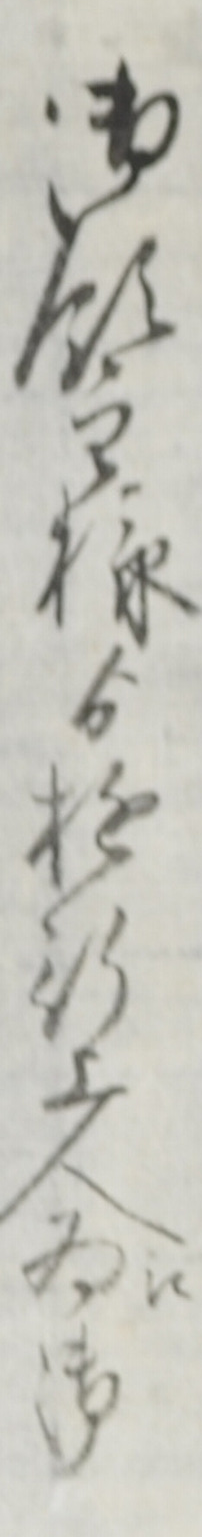御領主様ゟ遊行上人江為御
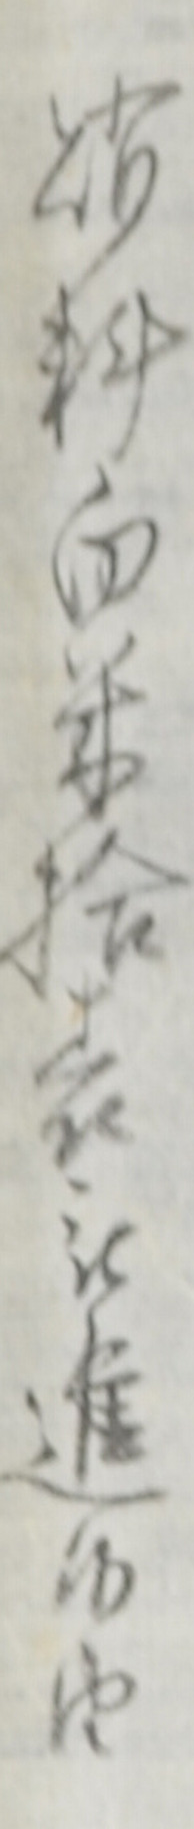賄料白米拾表被進候由
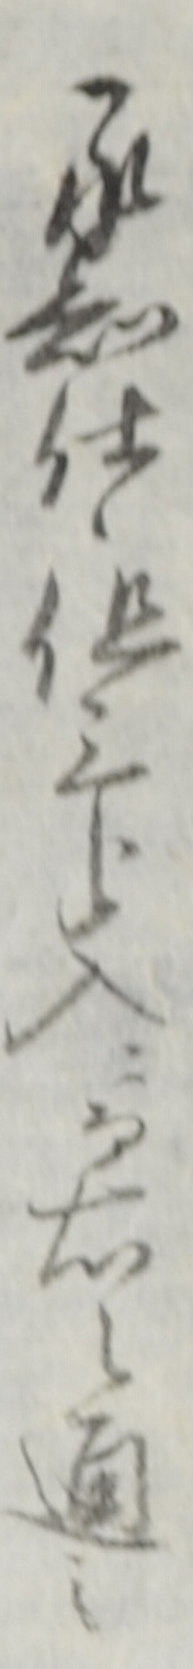承知仕候但三分ノ入ニ而右之通之
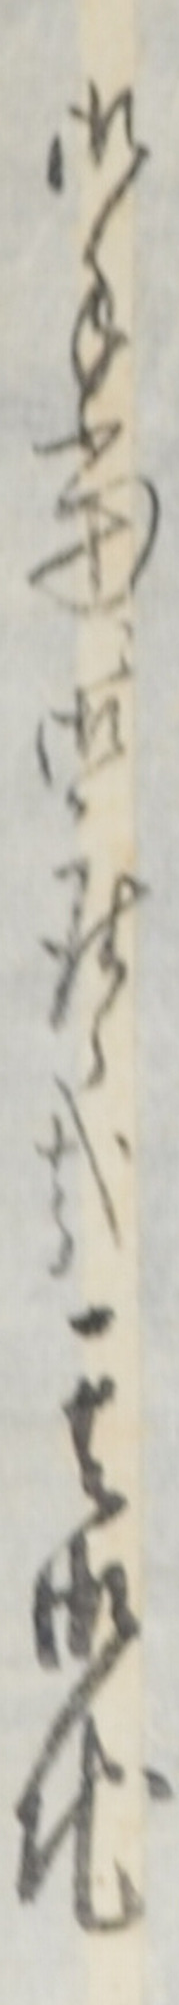御手当ニ御座候哉其御地
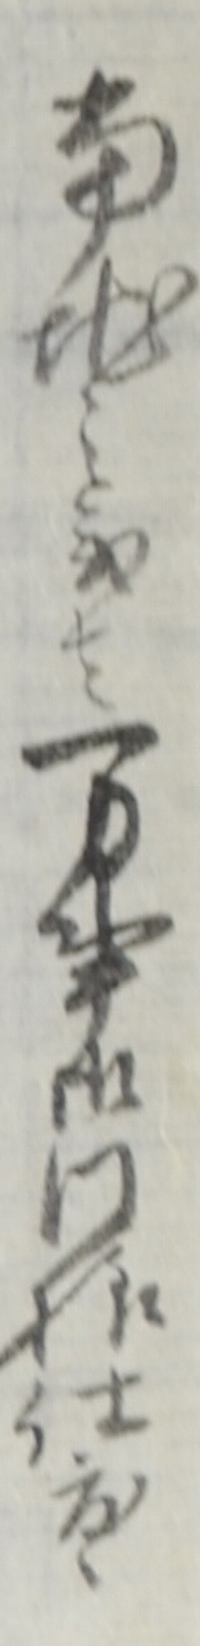当地之義は万事御同様仕度候
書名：（書状）
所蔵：伊那市立高遠町図書館・合同会社AMANE
